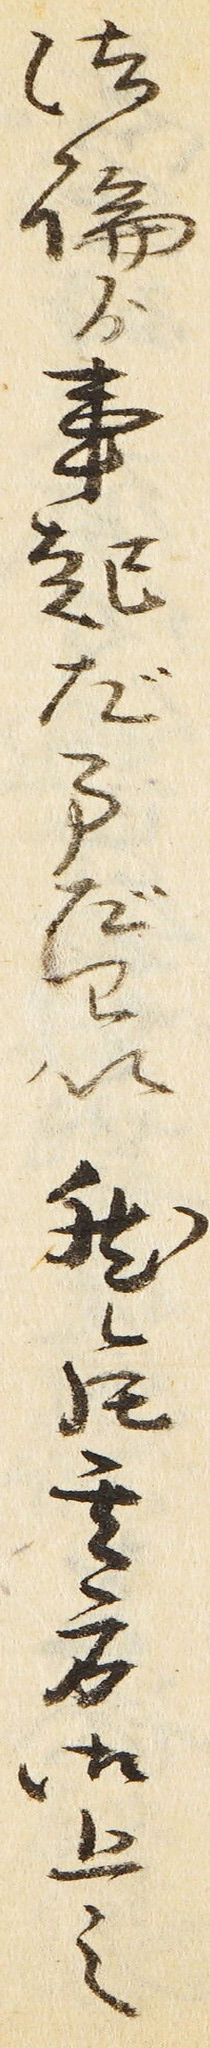法論ゟ事起だ事だわい然レとも其方御上之
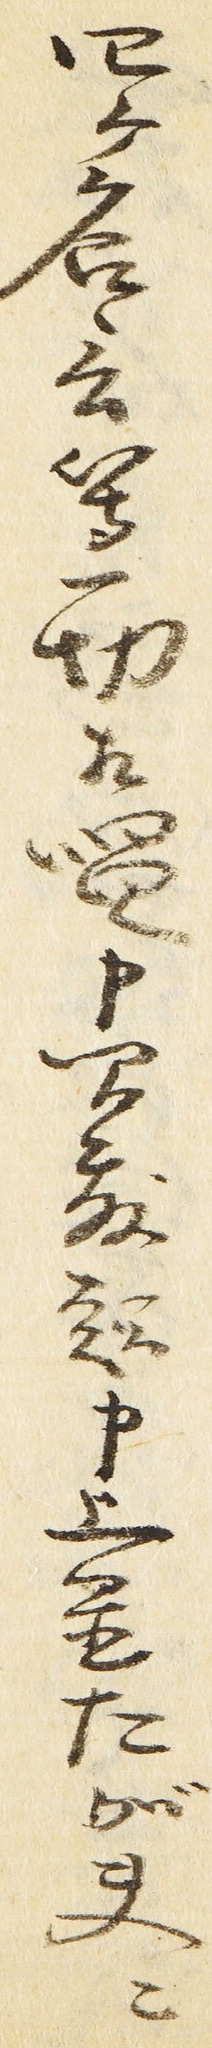四ケ名言等一切相唱へ申間敷趣申上置たが夫に
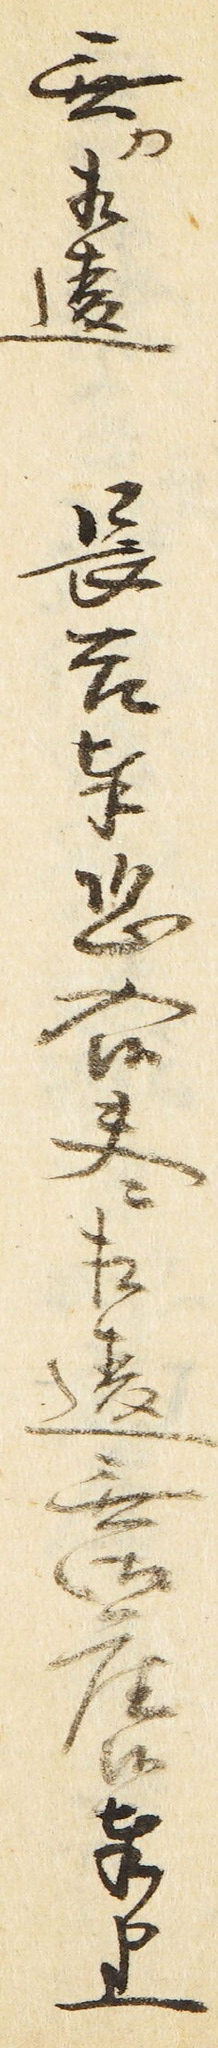無カ相違長吉奉恐入候夫に相違無御座候奉申上
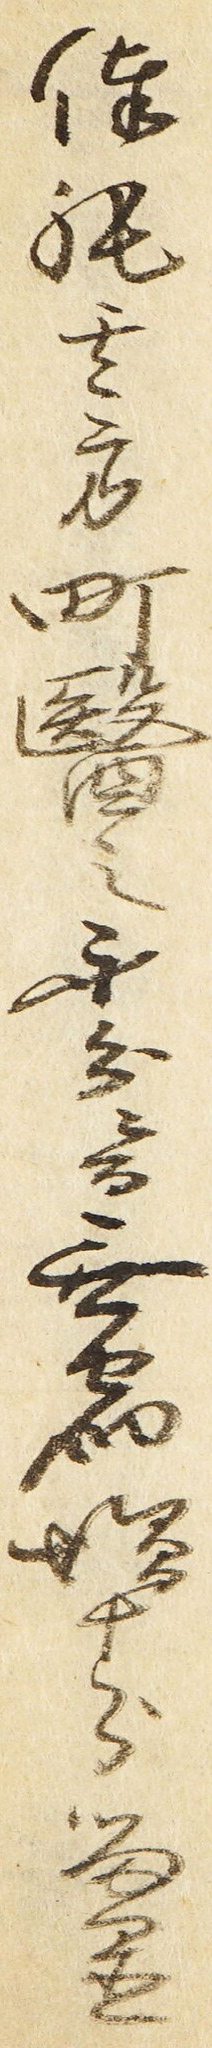俸純其方町医之身分に而無宿増十郎留置

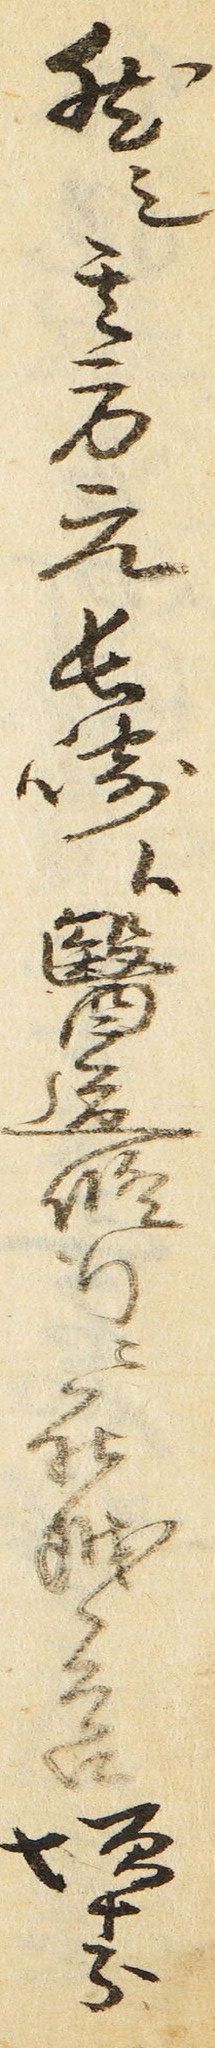然し其方元長崎江医道修行に罷越候節増十郎
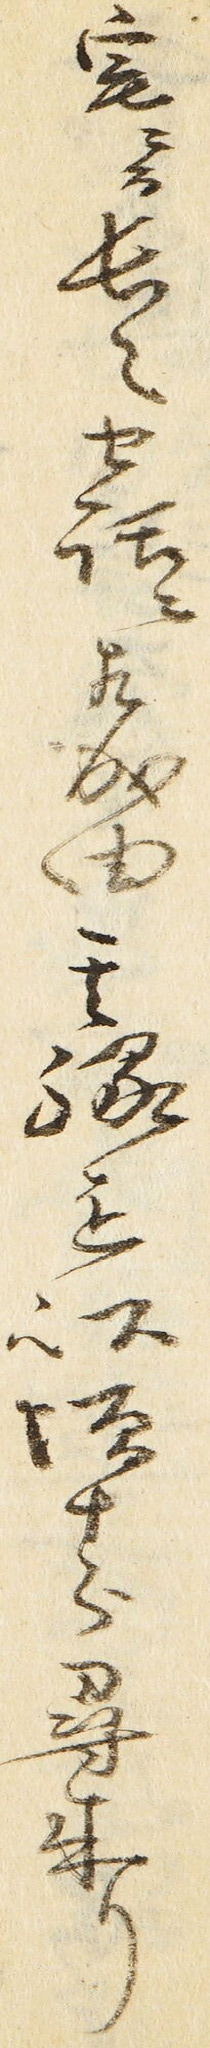宅に而長々せ話に相成由其縁を以増十郎尋来り
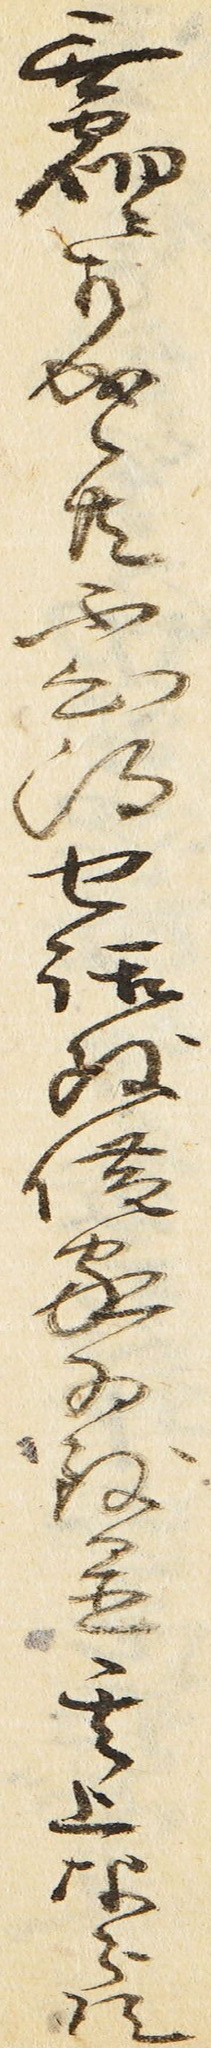無宿に相成候共不心得せ話致借家為致置其上ならす
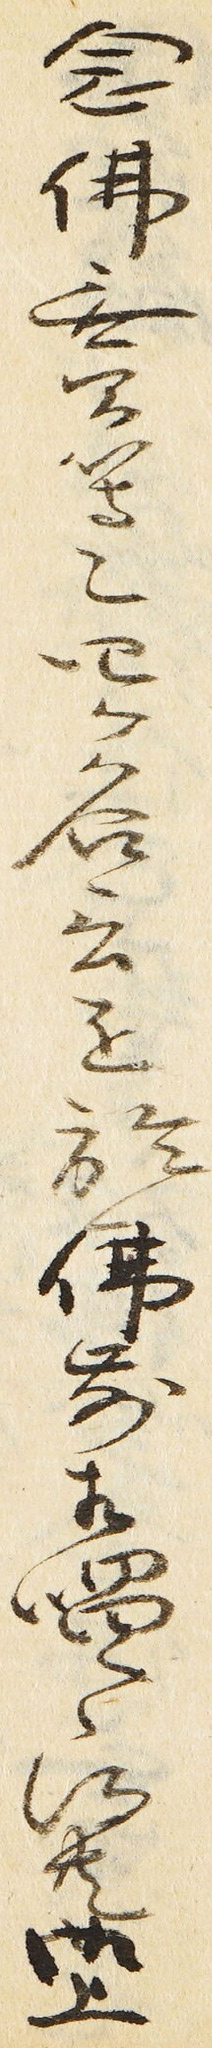念佛無間等之四ケ名言を於仏前相唱へ候得共御上
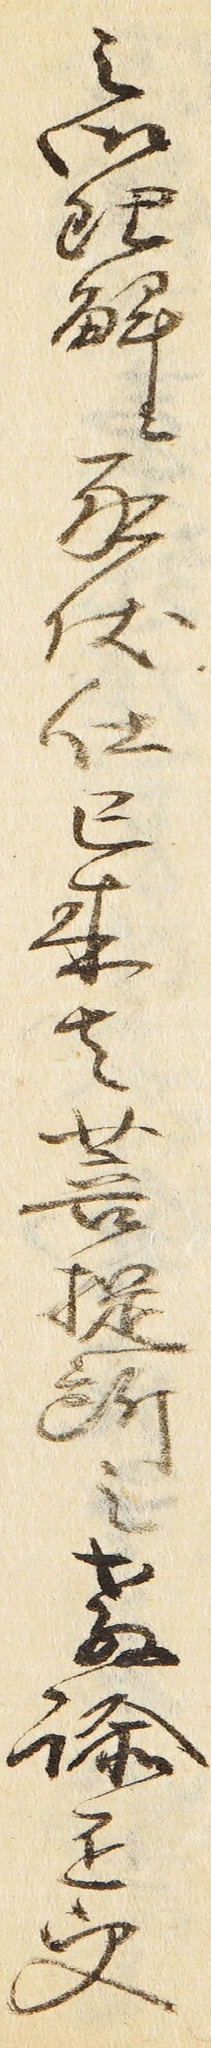之御理解に承伏仕已来は菩提所之教諭を受
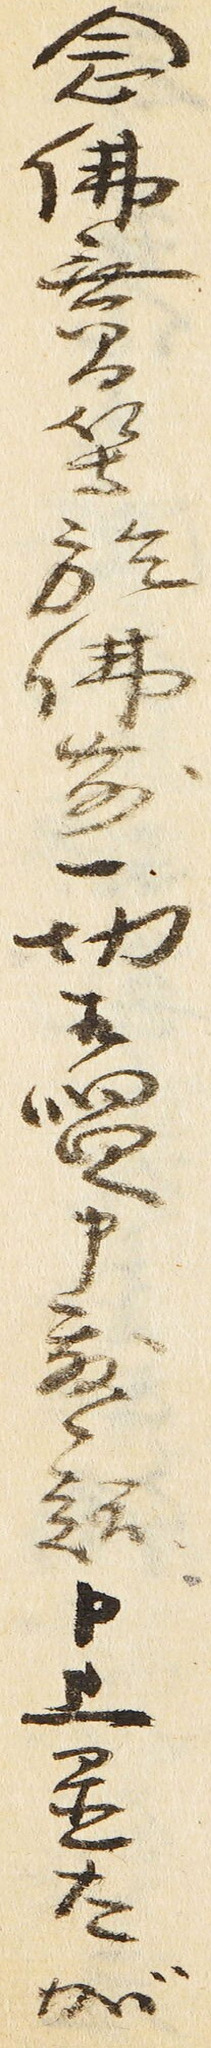念佛無間等於仏前一切相唱へ申敷候趣申上置たが
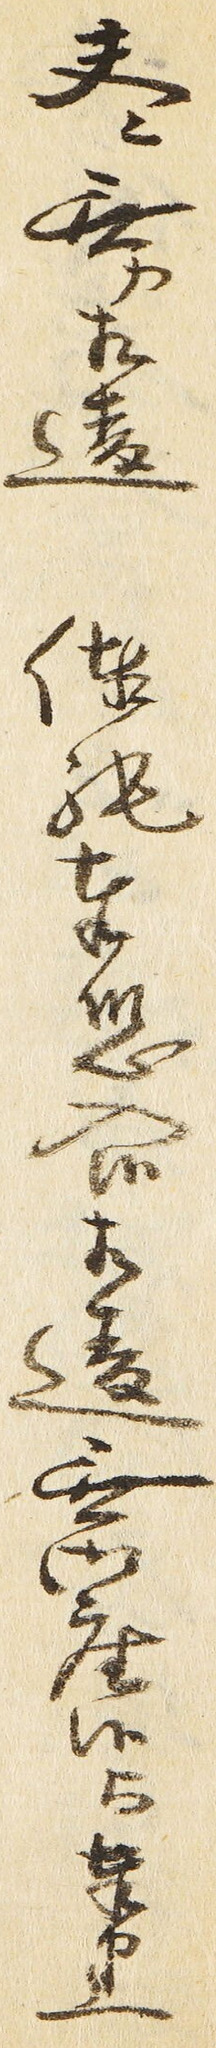夫に無カ相違俸純奉恐入候相違無御座候と奉申上
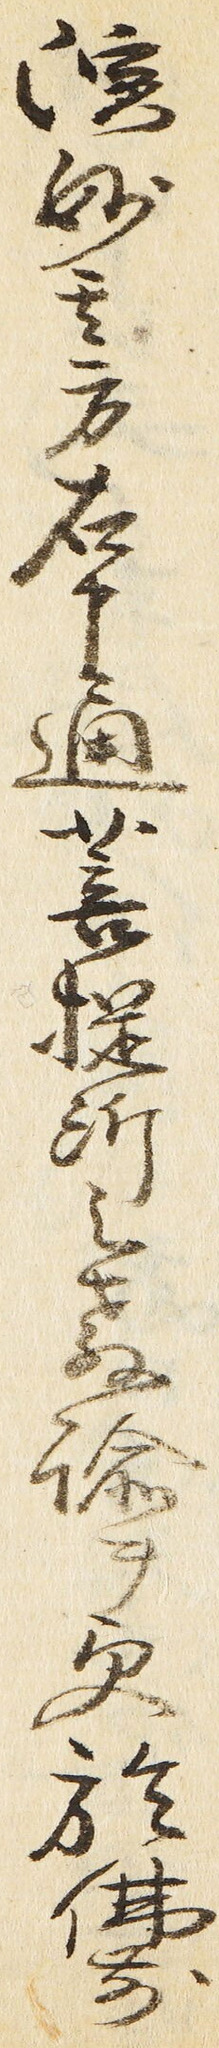演妙其方右申通菩提所之教諭ヲ受於仏前
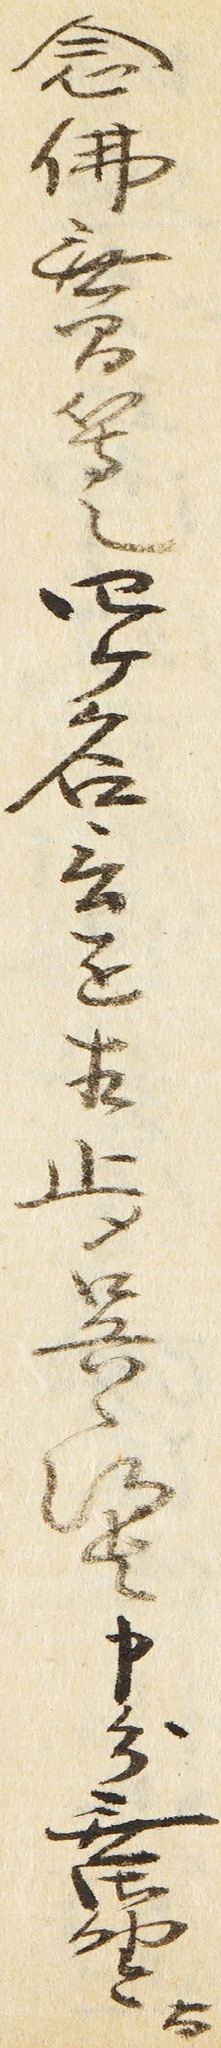念佛無間等之四ケ名言を相止メ呉候得は申分無御座候と
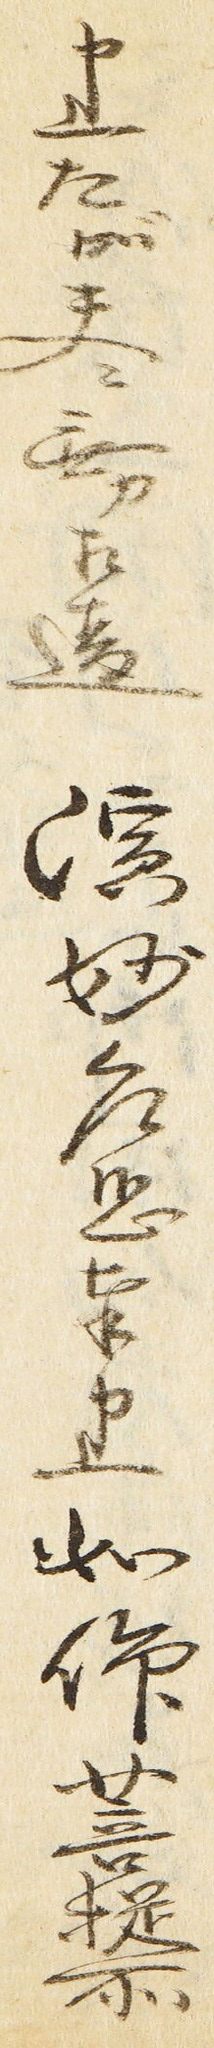申上たが夫に無カ相違演妙乍恐奉申上如仰菩提所
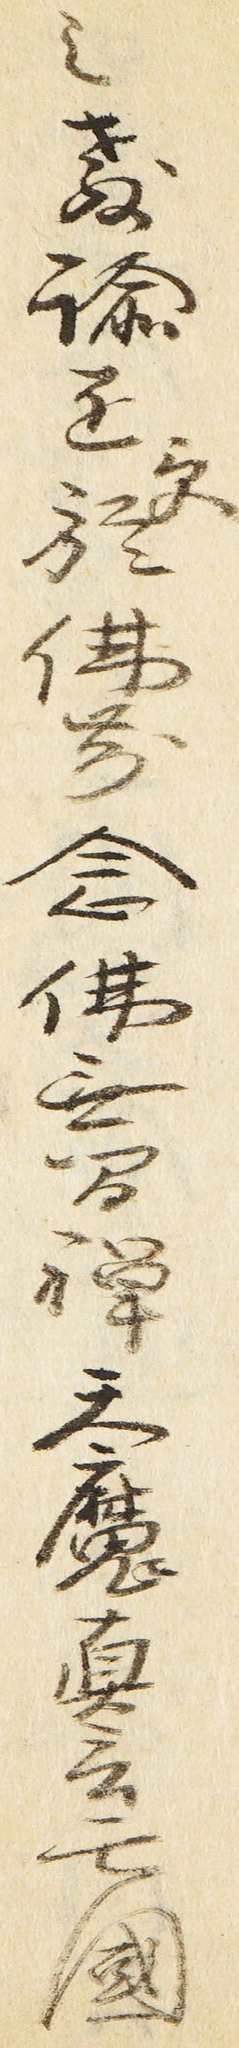之教諭を受於仏前念佛無間禅天魔真言亡国
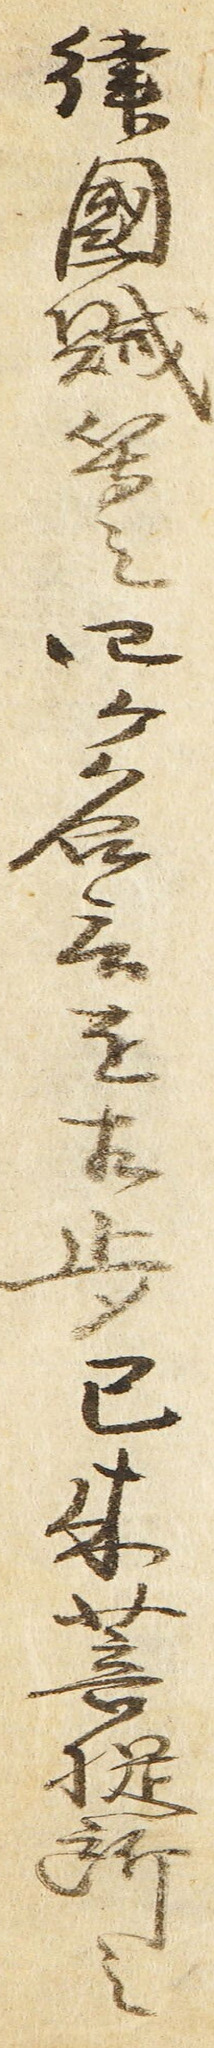律国賊等之四ケ名言を相止メ已来菩提所之
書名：異流一件日記
